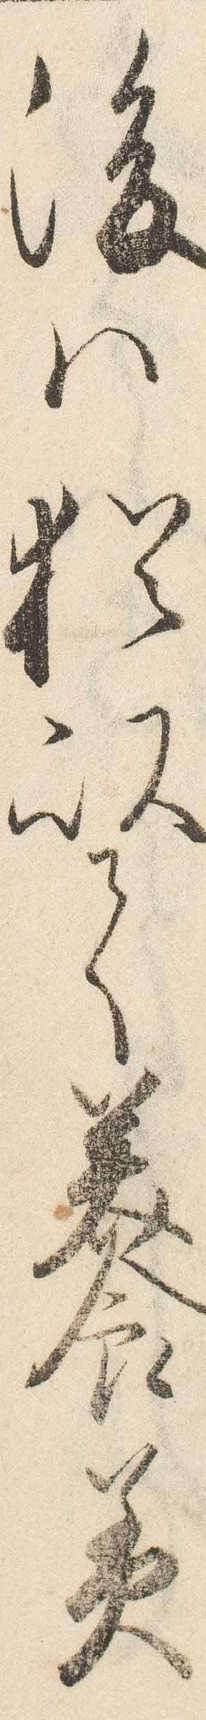後は猶以て美食美
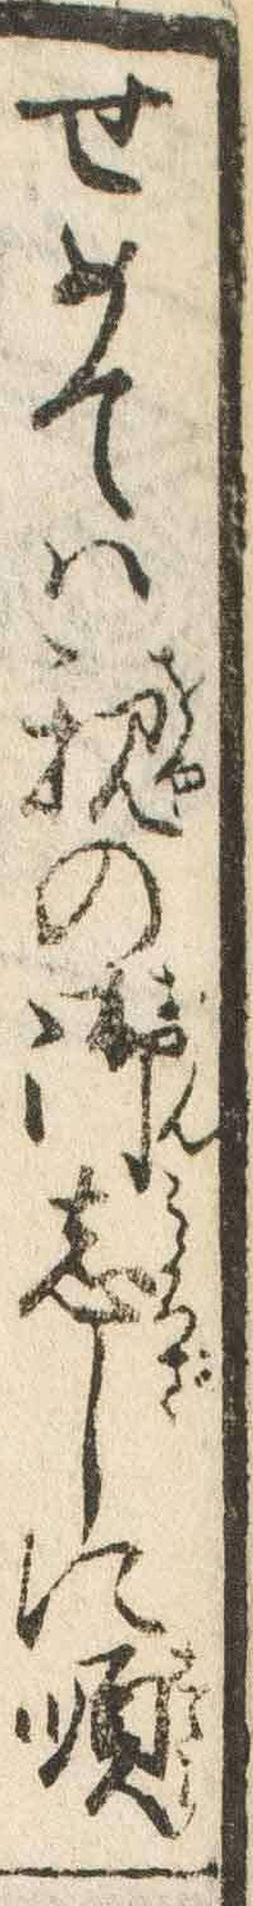せめては親の御志しに順
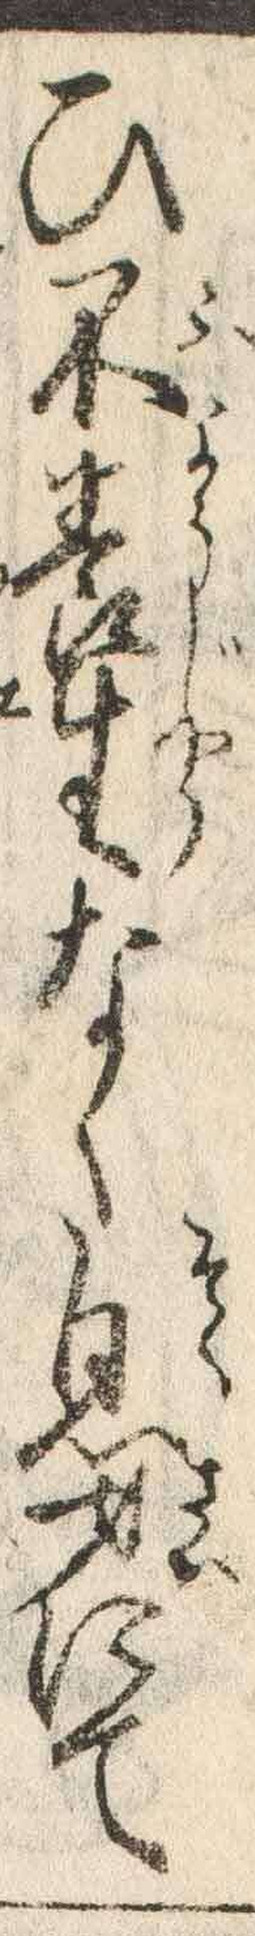ひ不養生なく息才にて
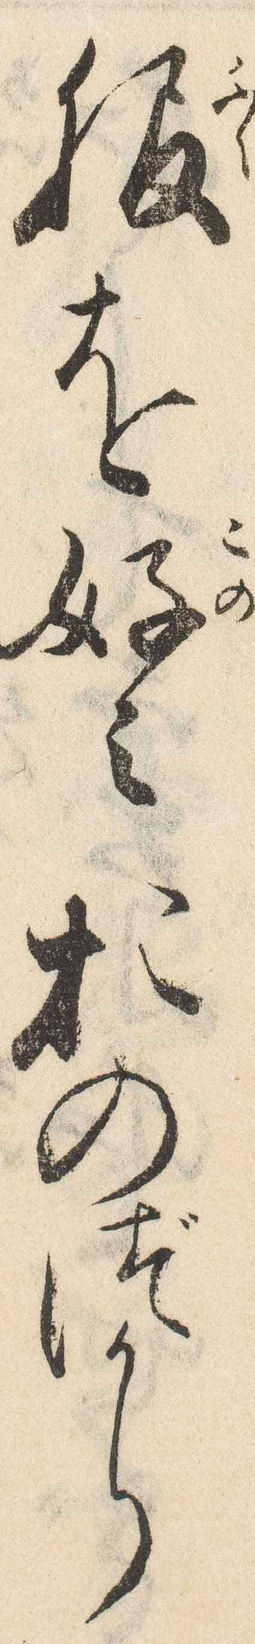服を好みおのづから
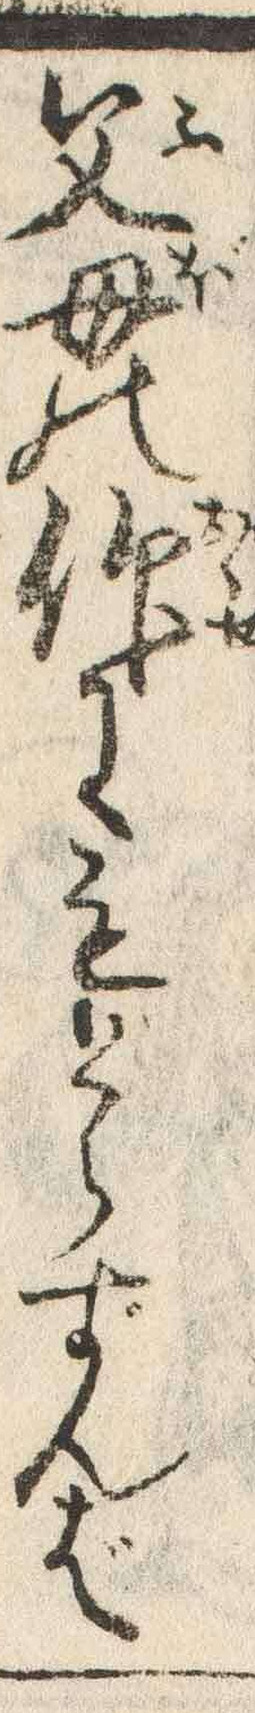父母の仰にもとらずんば
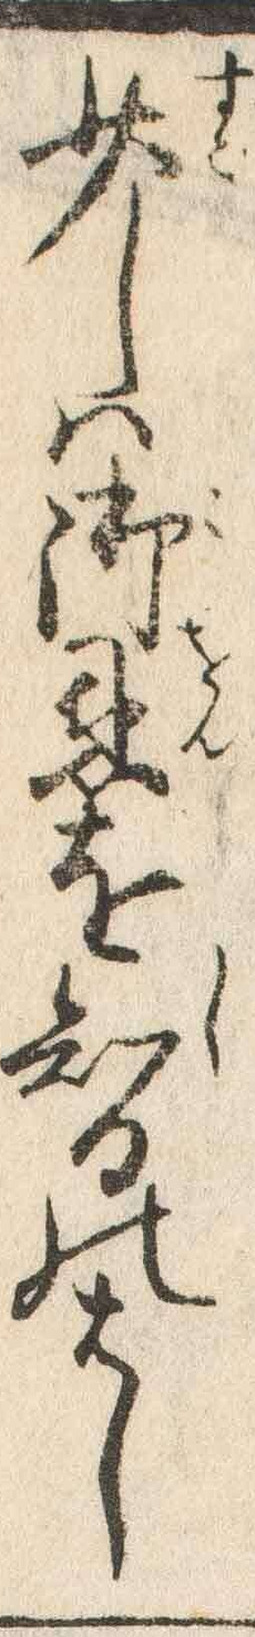少しは御恩を知るのはし
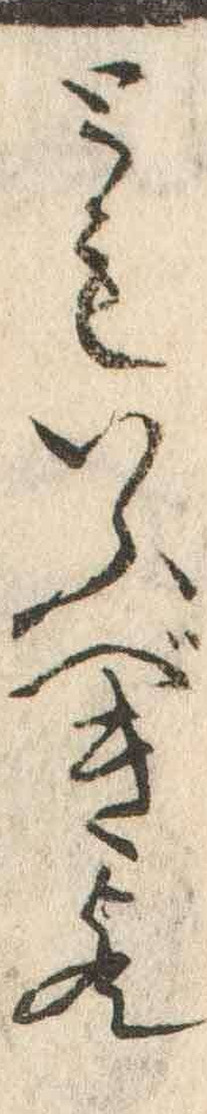ともいふべきか
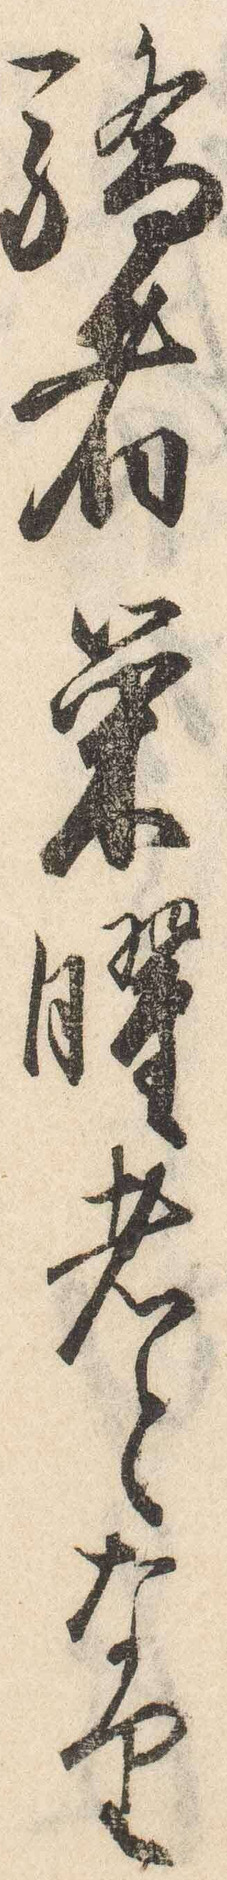驕者栄曜者となり
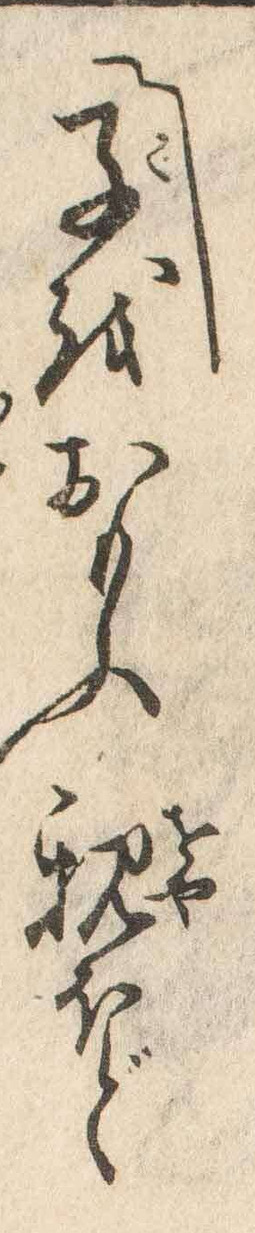〽子をおもふ親ほど
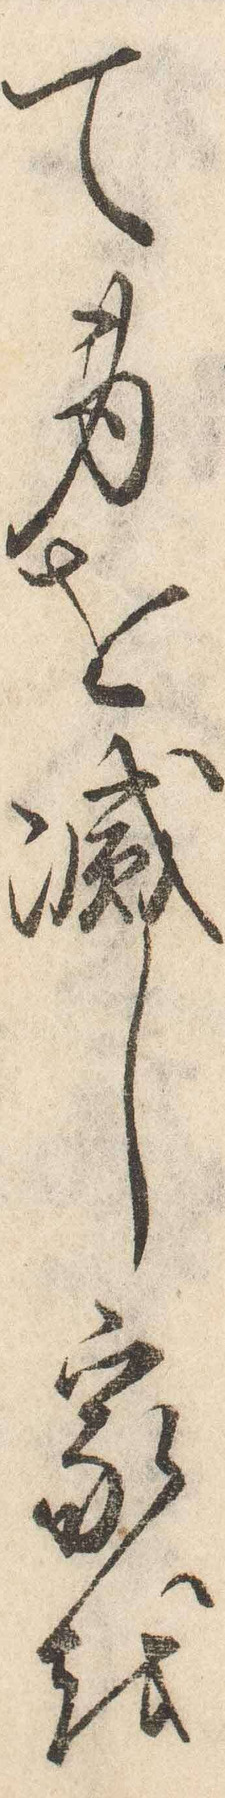て身を滅し家を
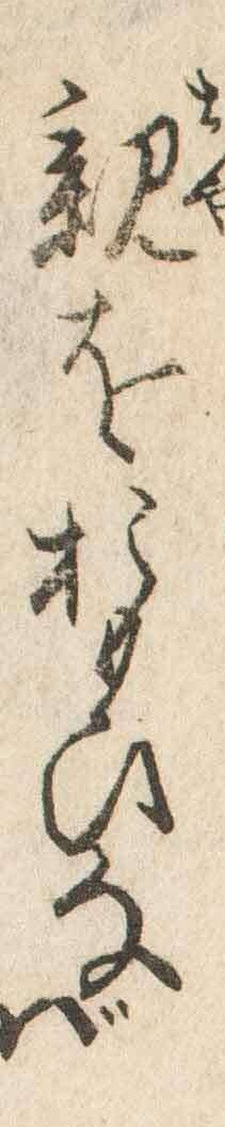親をおもひなば
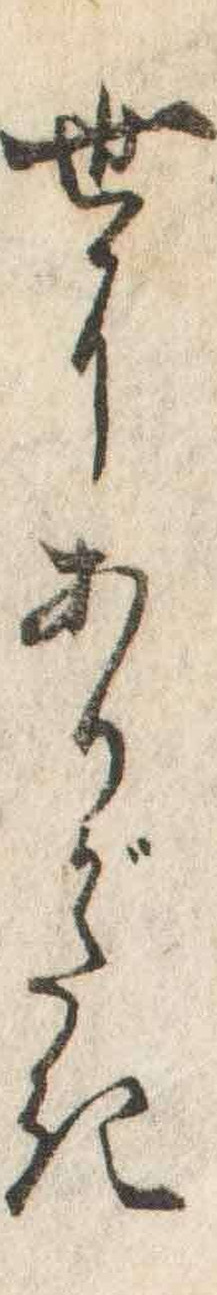世にありがたき
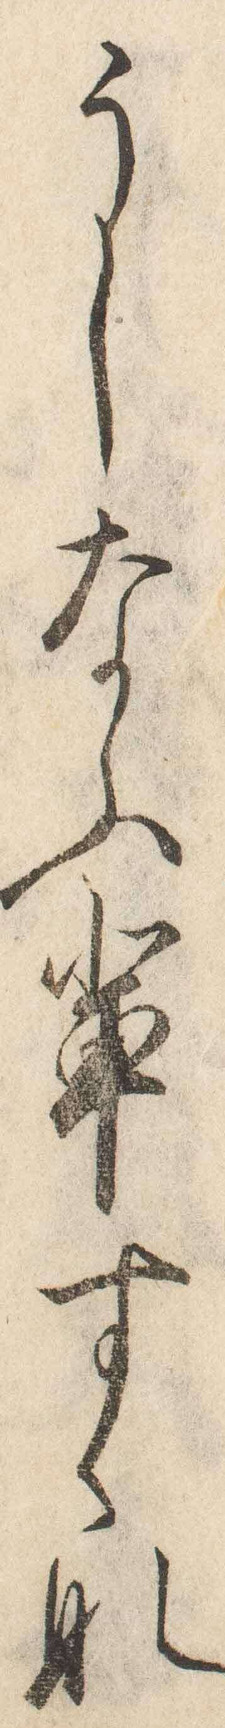うしなふ輩すくな
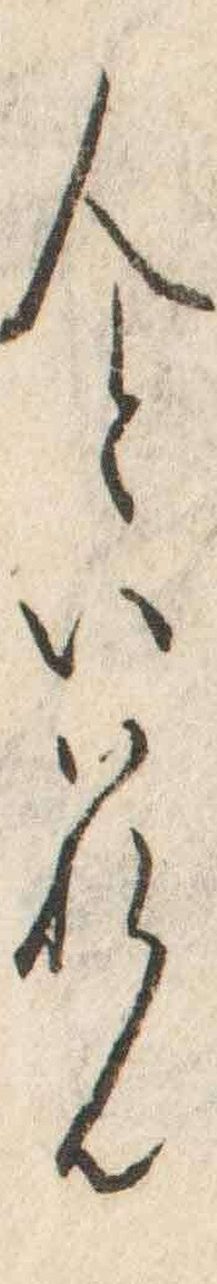人といはれん
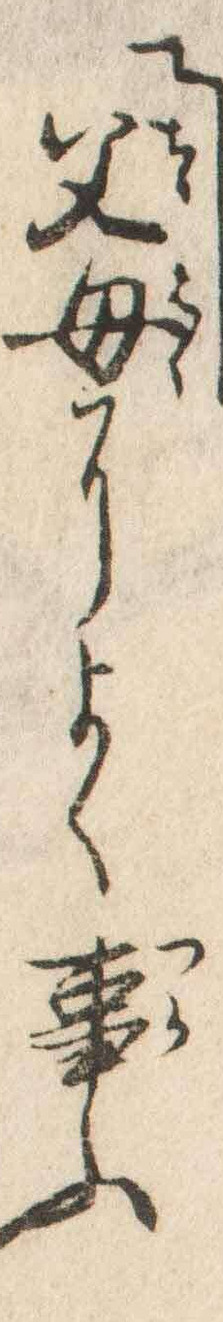〽父母によく事ふ
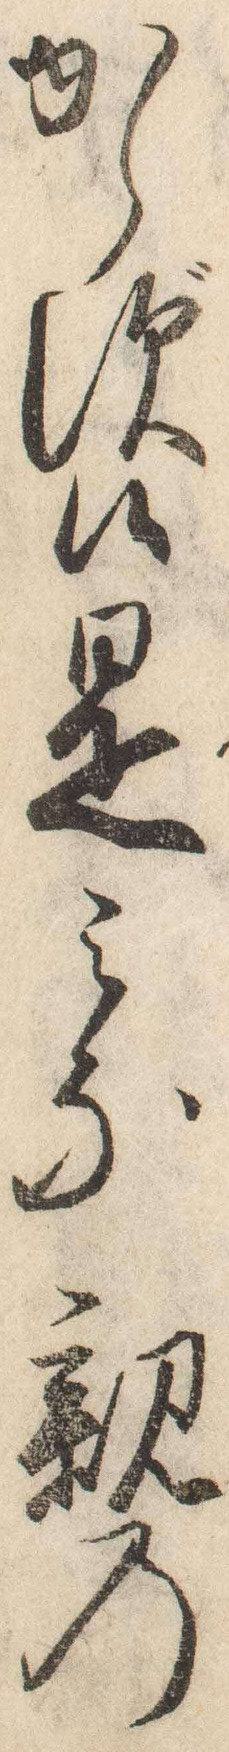からず候是みな親の
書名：撫育草
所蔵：東京学芸大学附属図書館 国文学研究資料館
